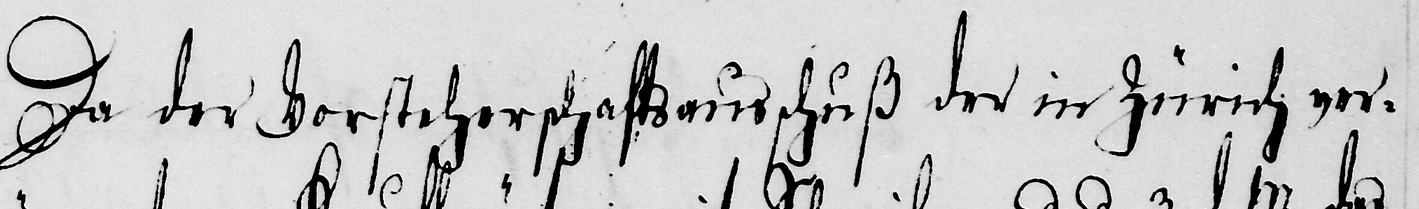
Da der Vorsteherschaftsausschuß der in Zürich ver¬
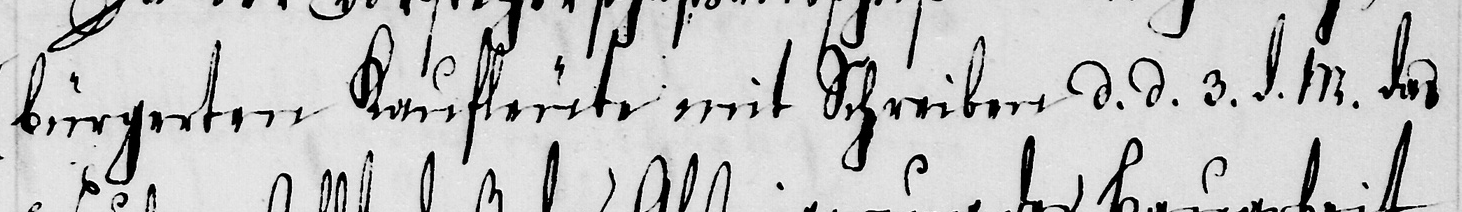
bürgerten Kaufleute mit Schreiben d. d. 3. d. M. das
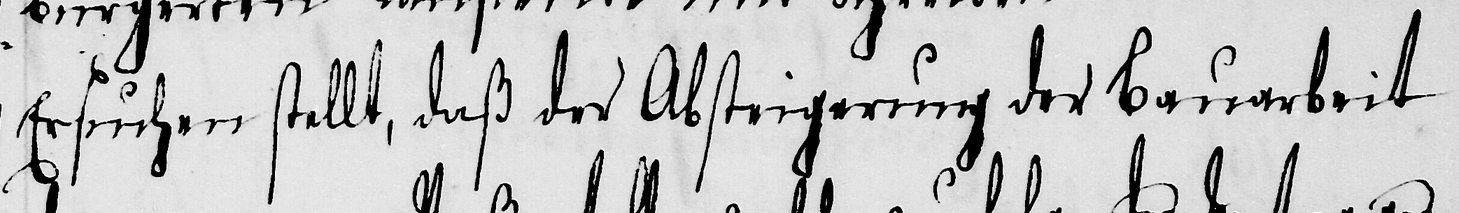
Ersuchen stellt, daß der Absteigerung der Bauarbeit
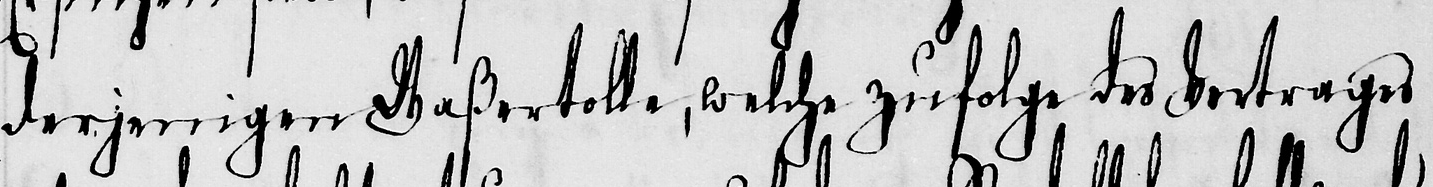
derjenigen Waßertolle, welche zufolge des Vertrages
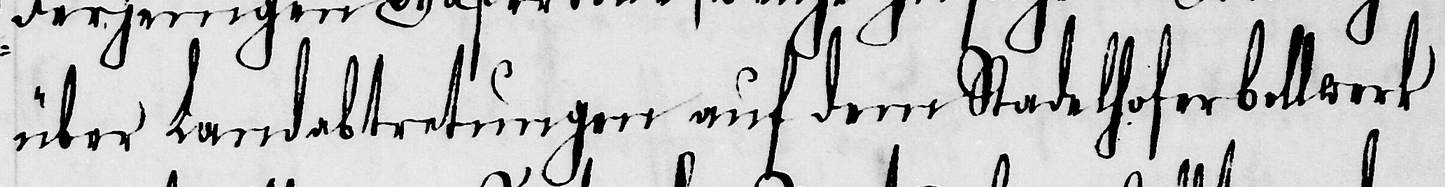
über Landabtretungen auf dem Stadelhoferbollwerk
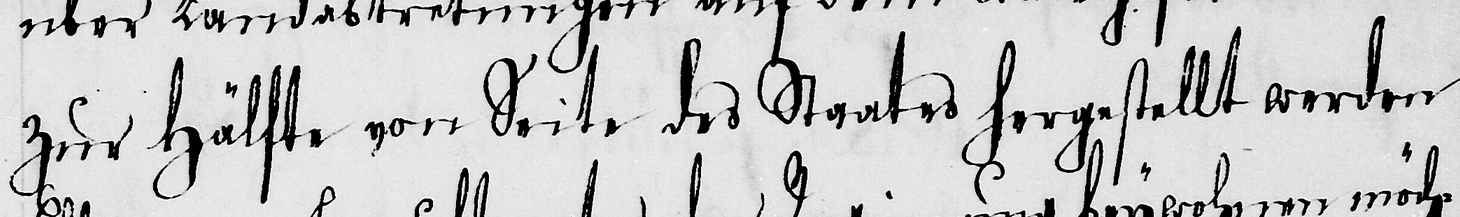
zur Hälfte von Seite des Staates hergestellt werden
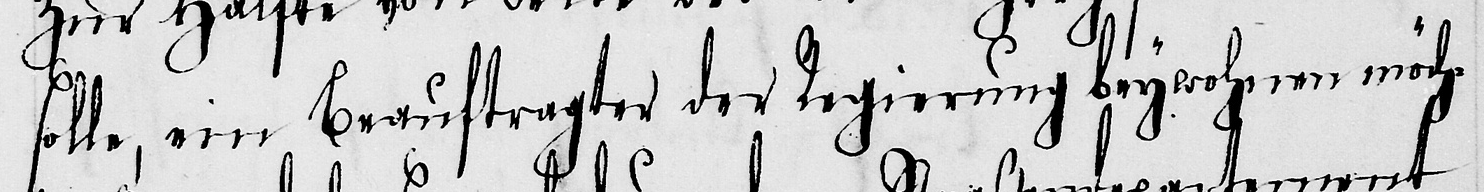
solle, ein Beauftragter der Regierung beywohnen möcht¬
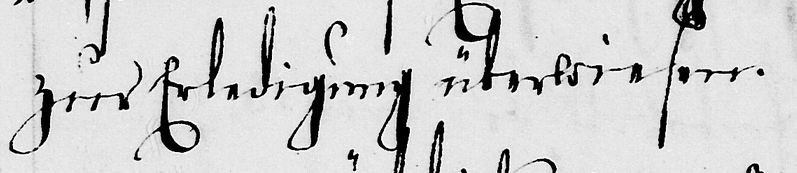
zur Erledigung überwiesen.
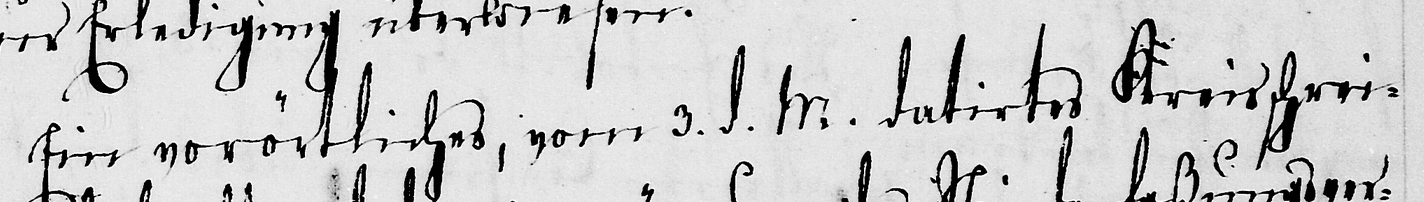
Ein vorörtliches, vom 3. d. M. datirtes Kreisschrei¬
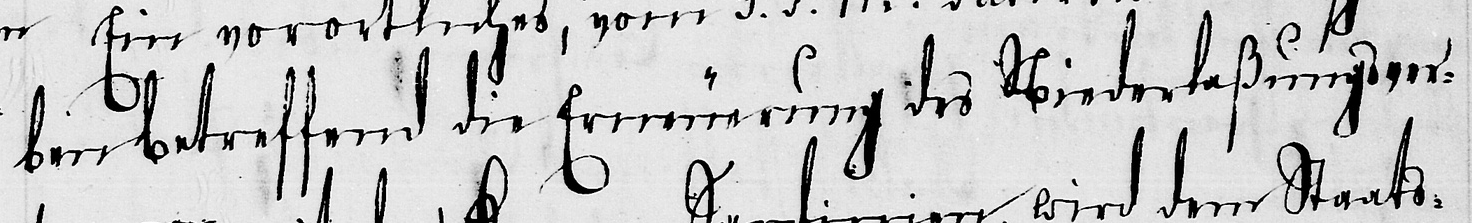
ben betreffend die Erneuerung des Niederlaßungsver¬
